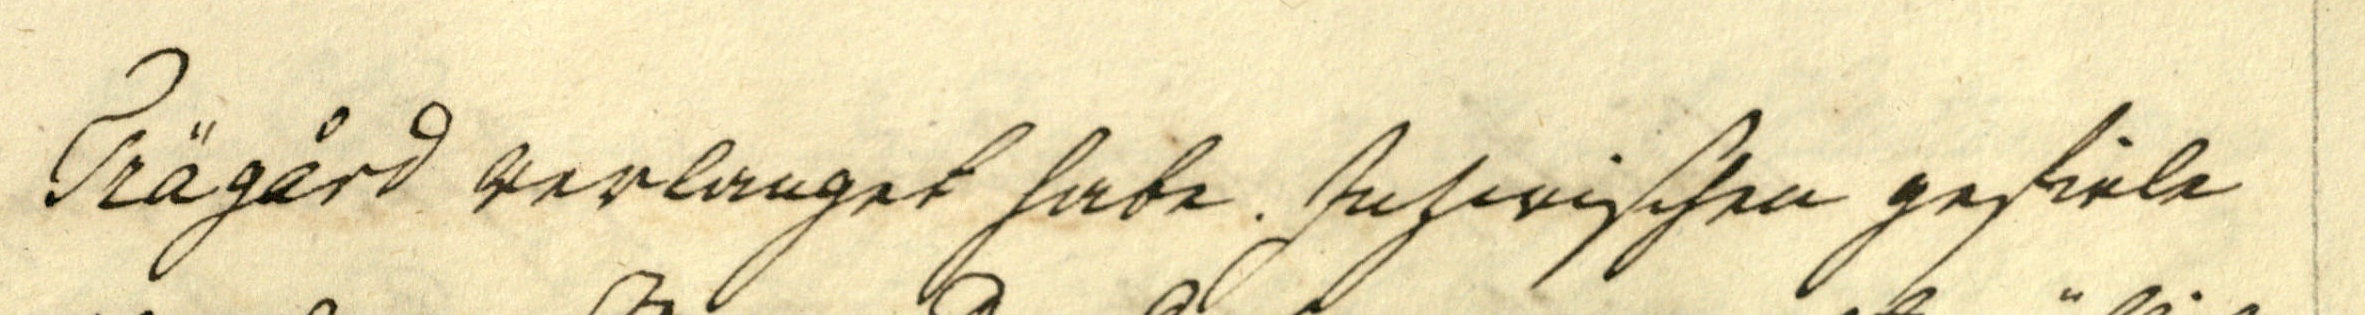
Trägård verlanget habe. Inzwischen gefiele
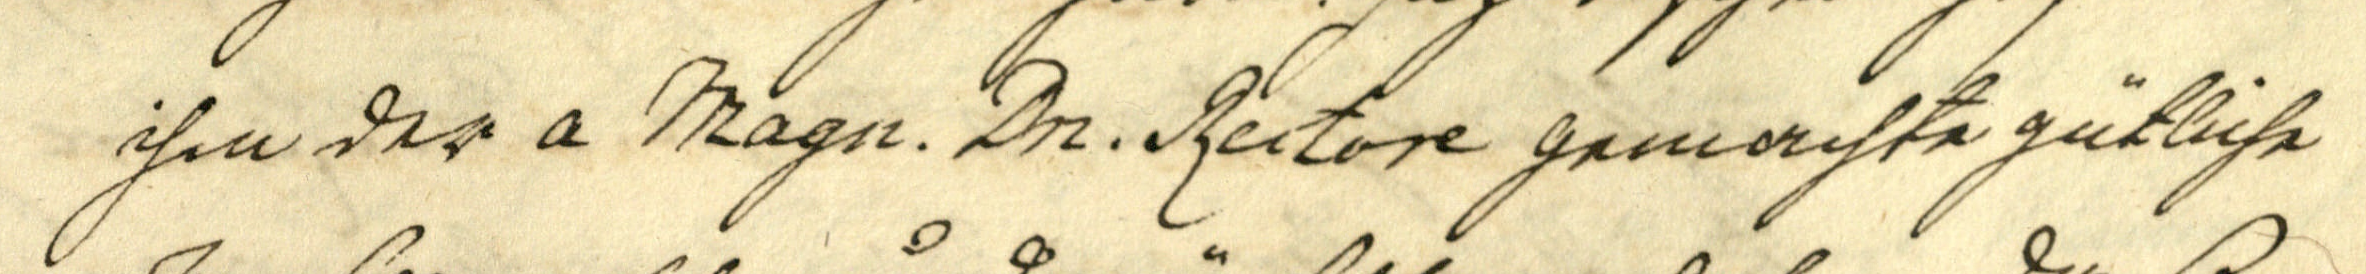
ihm der a Magn. Dn. Rectore gemachte gütliche
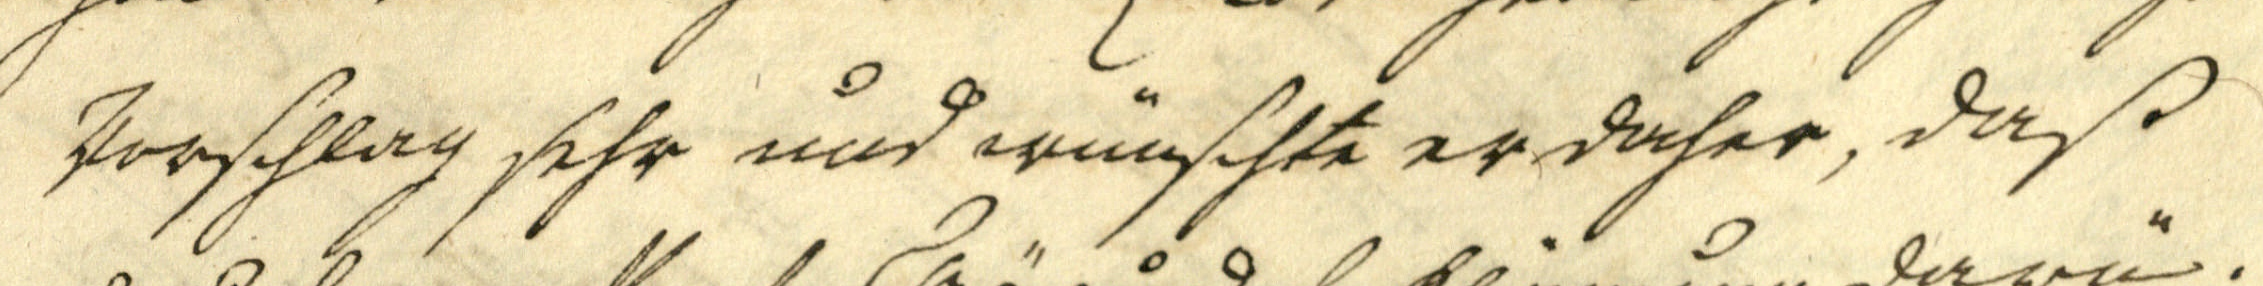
Vorschlag sehr und wünschte er daher, daß
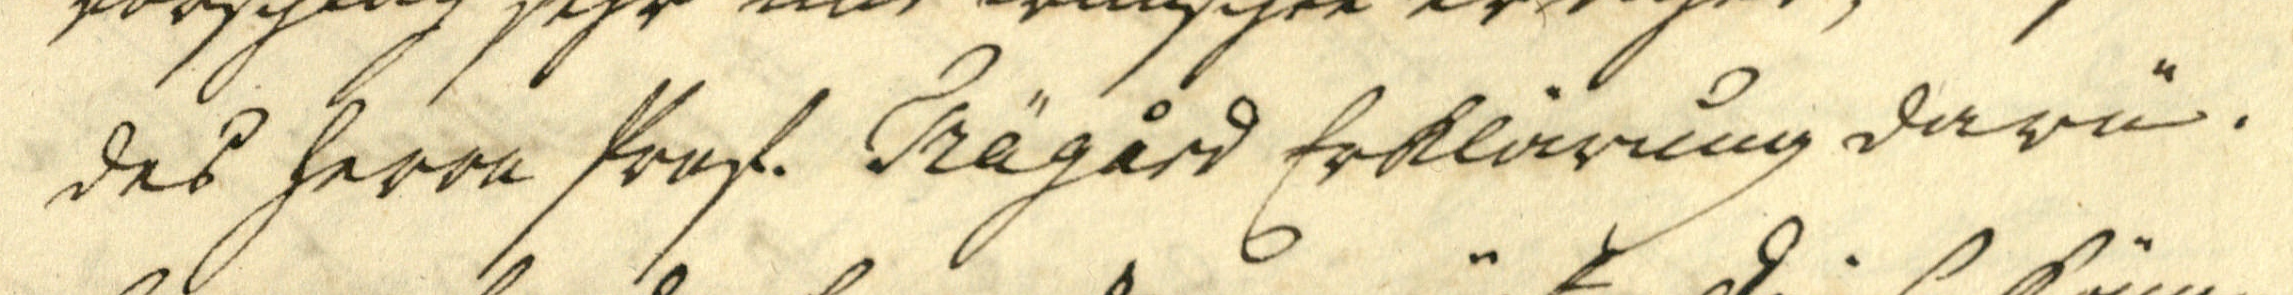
des Herrn Prof. Trägård Erklärung darü¬
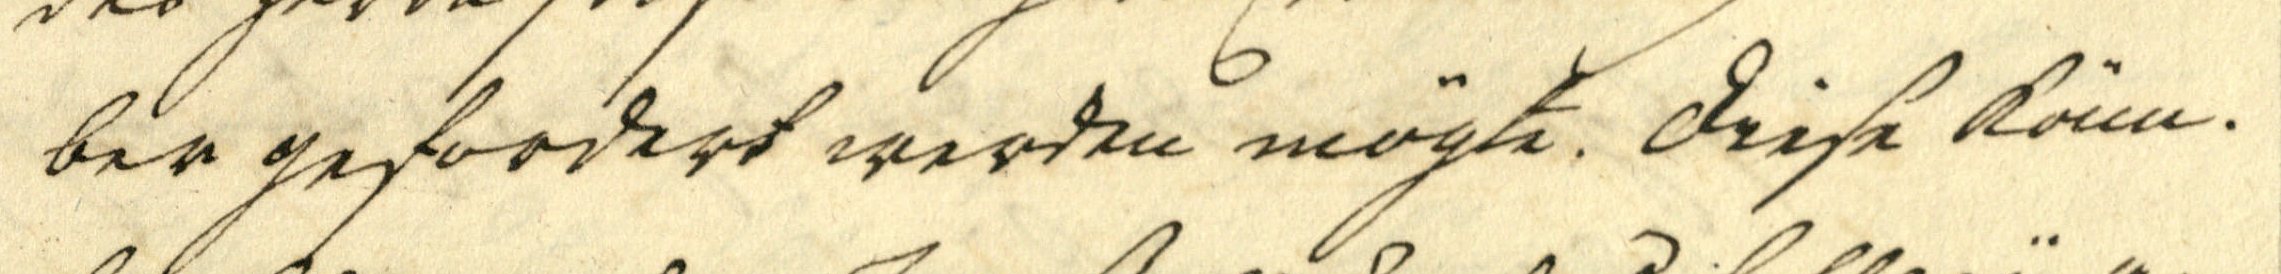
ber gefordert werden mögte. Diese könne¬
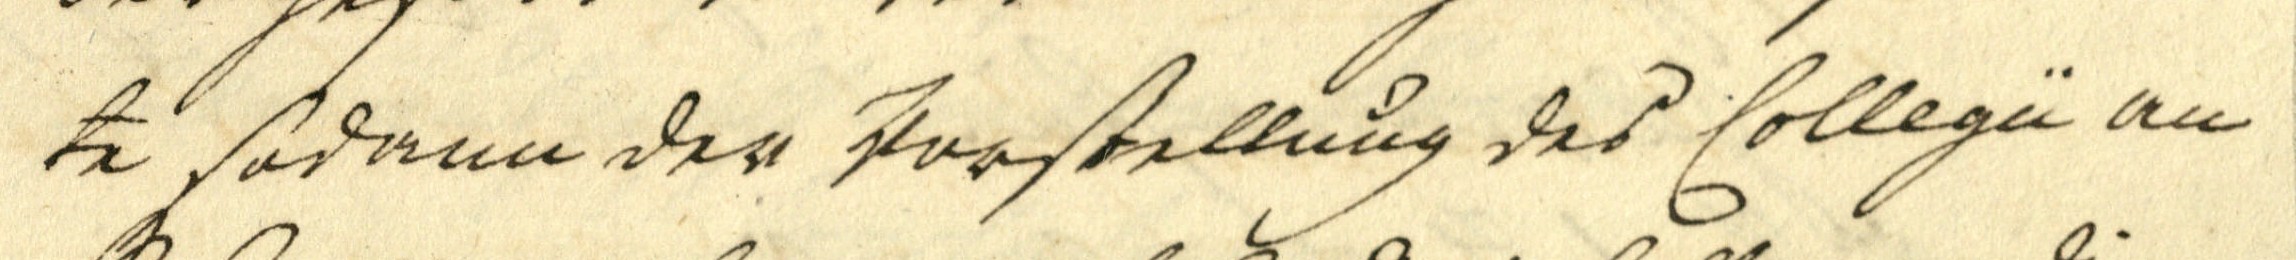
te sodann der Vorstellung des Collegii an
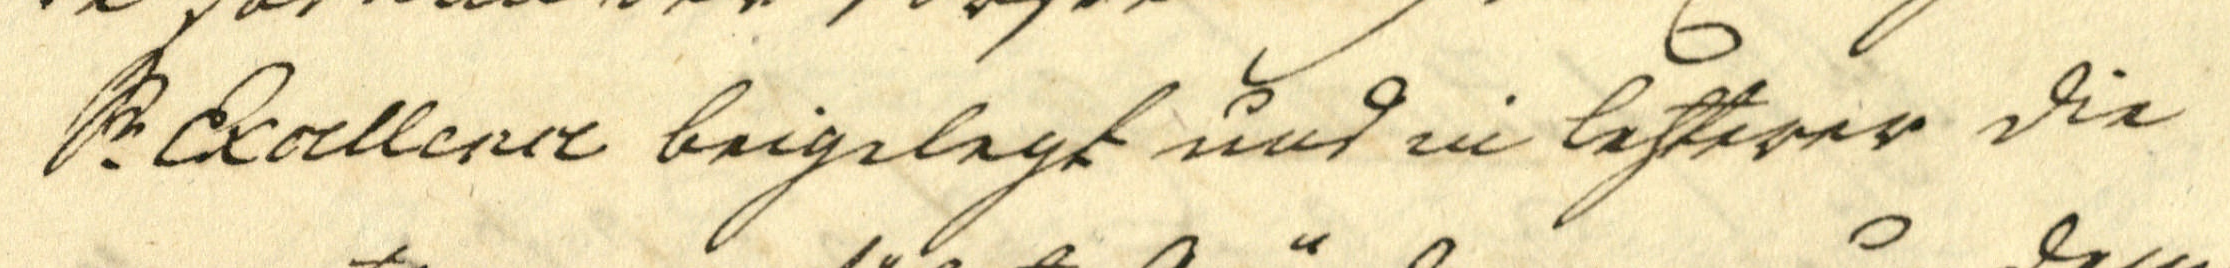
Sr. Excellence beigelegt und in letzterer die
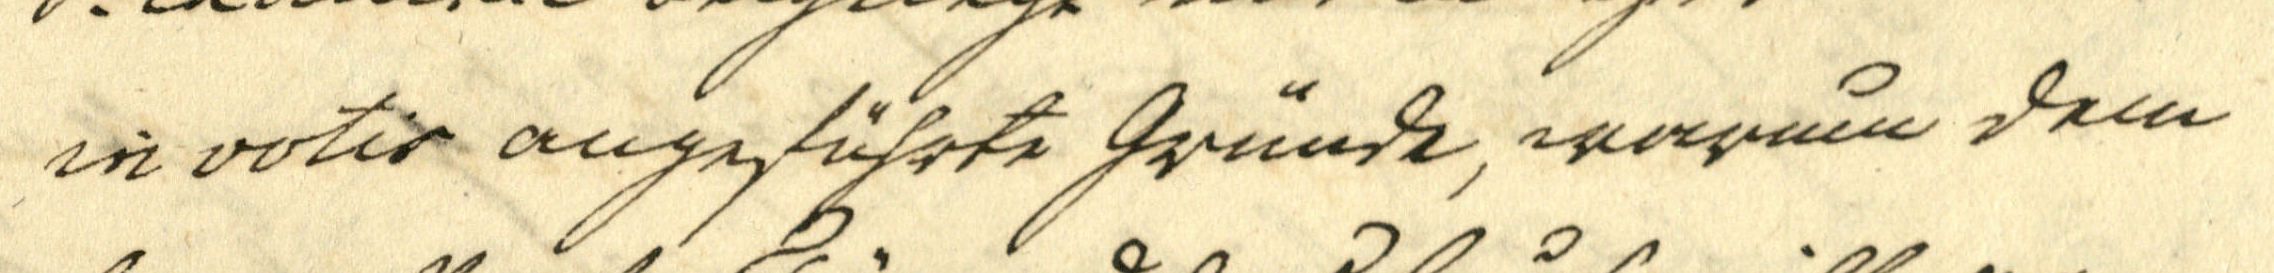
in votis angeführte Gründe, warum dem
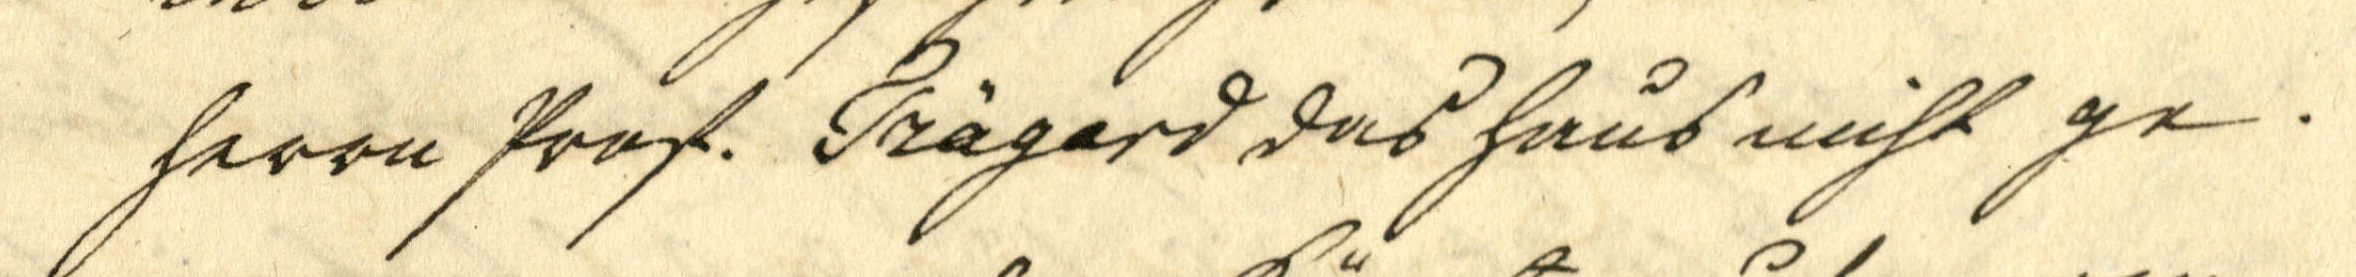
Herrn Prof. Trägård das Haus nicht ge¬
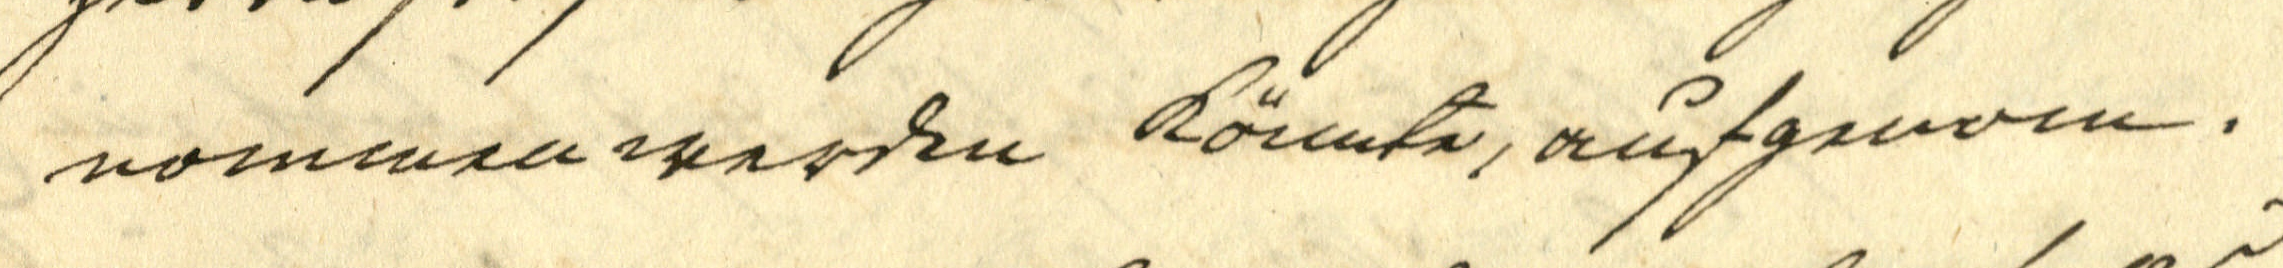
nommen werden könnte, aufgenom¬
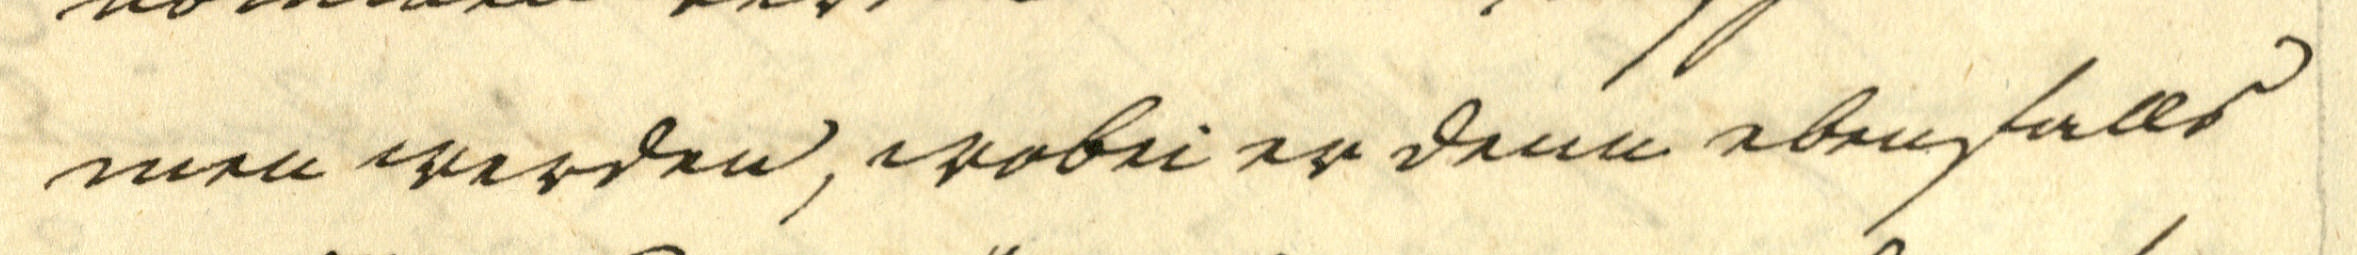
men werden, wobei er denn ebenfalls
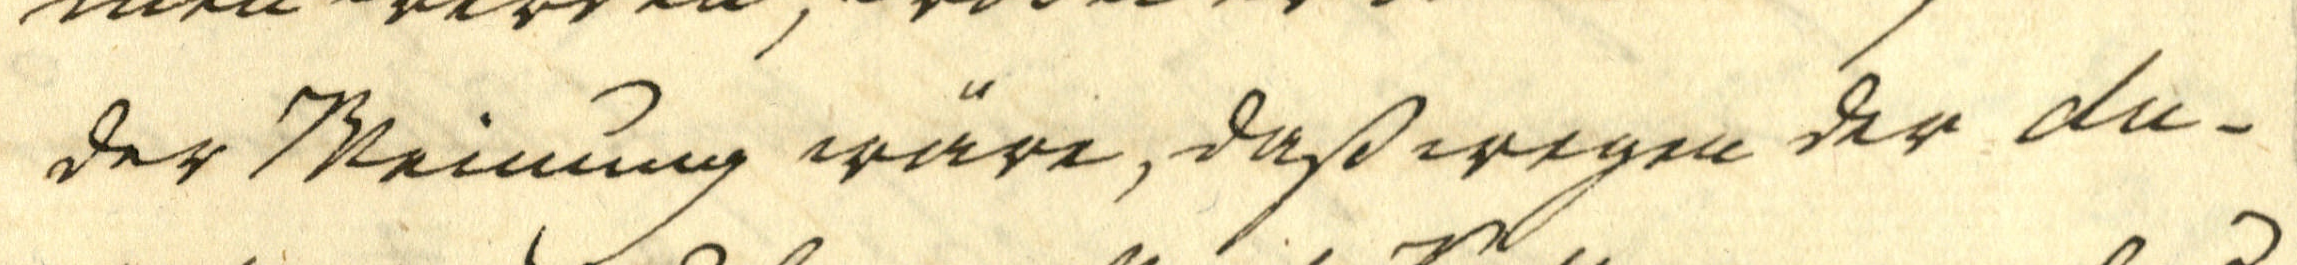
der Meinung wäre, daß wegen der du¬
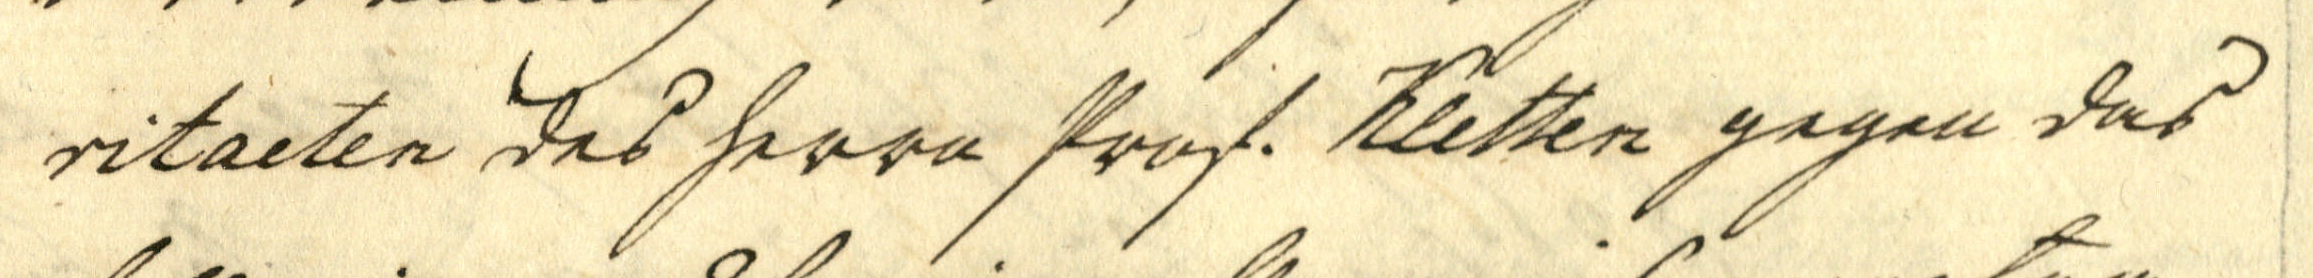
ritaeten des Herrn Prof. Kletten gegen das
